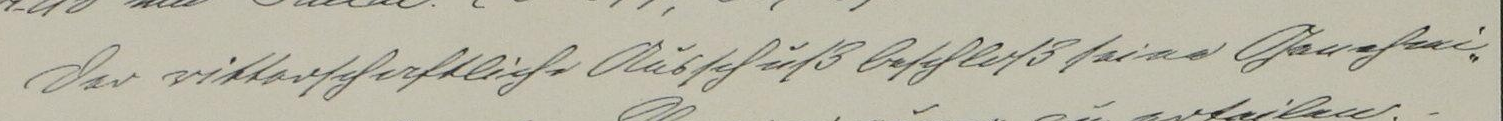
Der ritterschaftliche Ausschuß beschloß seine Genehmi-
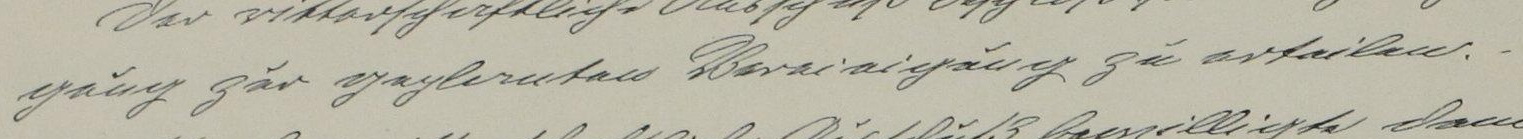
gung zur geplanten Vereinigung zu erteilen.
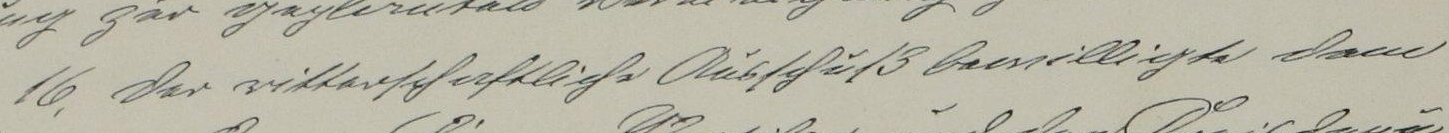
16. Der ritterschaftliche Ausschuß bewilligte dem
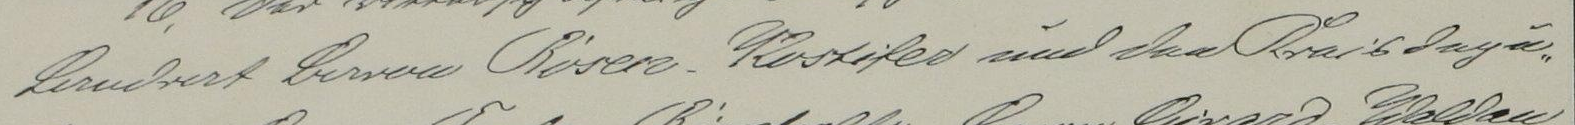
Landrat Baron Rosen-Kostifer und den Kreisdepu-
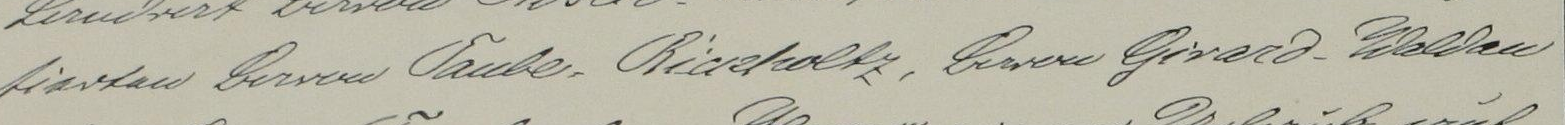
tierten Baron Taube-Rickholtz, Baron Girard-Waldau
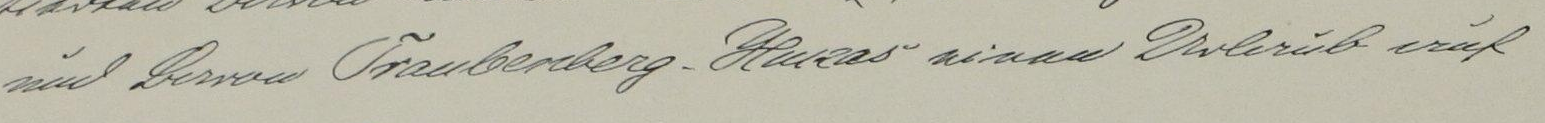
und Baron Traubenberg-Hukas einen Urlaub auf
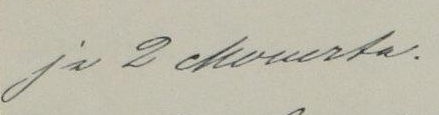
je 2 Monate.
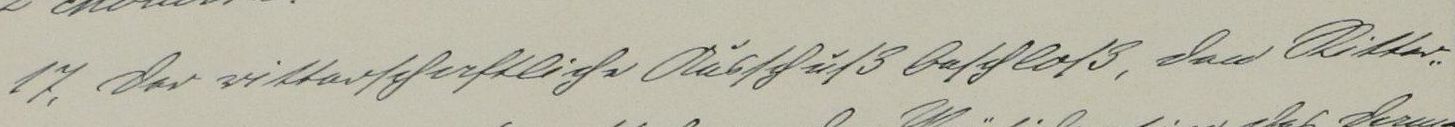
17. Der ritterschaftliche Ausschuß beschloß, den Ritter-
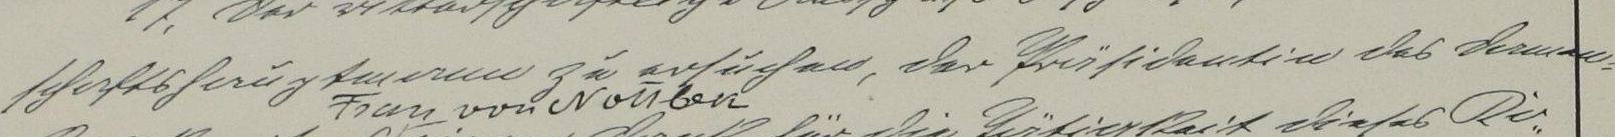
schaftshauptmann zu ersuchen, der Präsidentin des Damen-
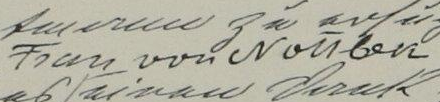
Frau von Nottbek
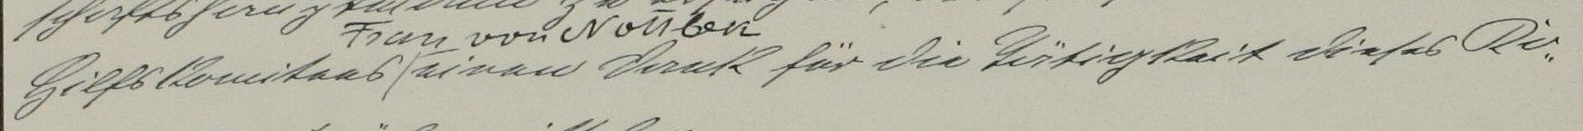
Hilfskomitees einen Dank für die Tätigkeit dieses Ko-
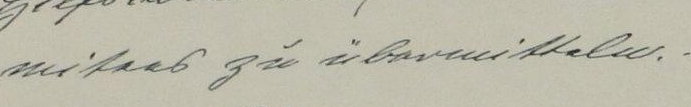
mitees zu übermitteln.
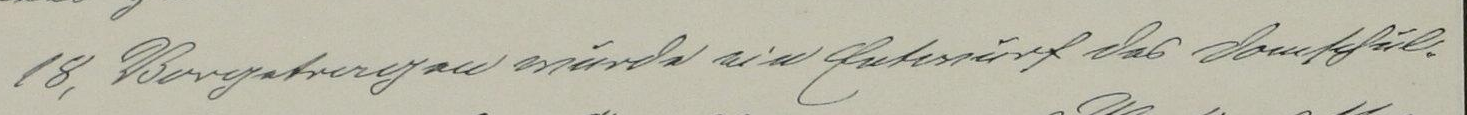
18. Vorgetragen wurde ein Entwurf des Domschul-
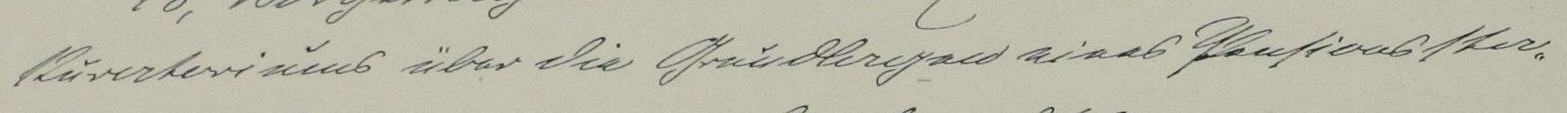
kuratoriums über die Grundlagen eines Pensionssta-
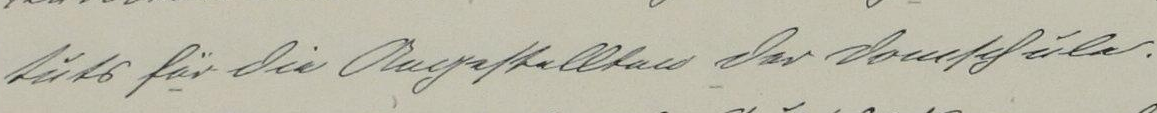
tuts für die Angestellten der Domschule.
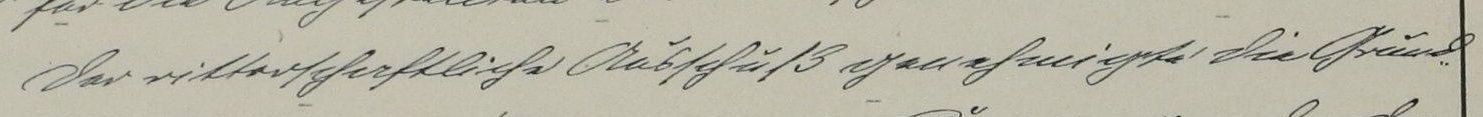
Der ritterschaftliche Ausschuß genehmigte die Grund-
